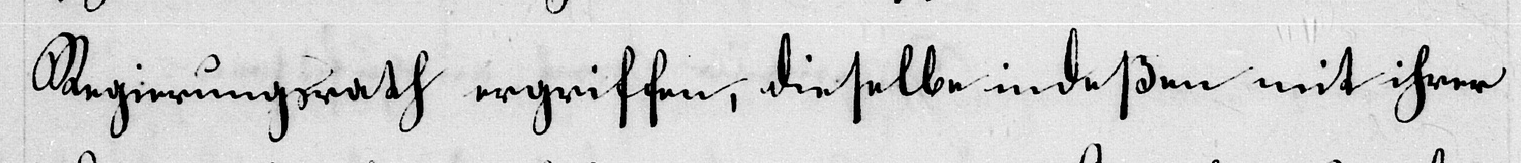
Regierungsrath ergriffen, dieselbe indeßen mit ihrer
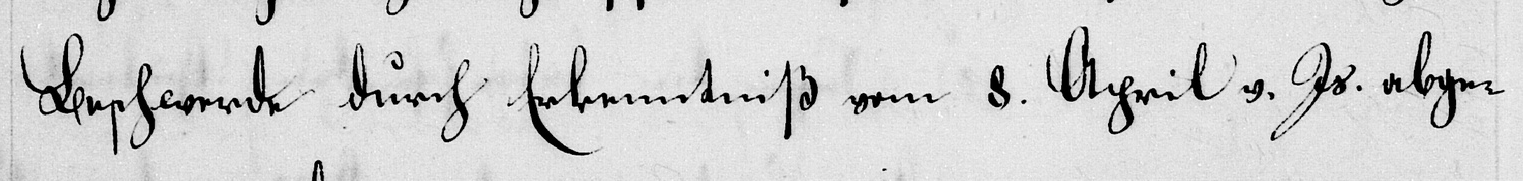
Beschwerde durch Erkenntniß vom 8. April v. Js. abge¬
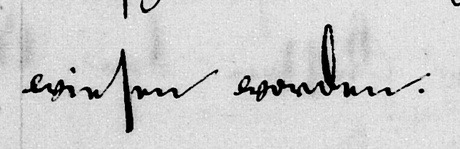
wiesen worden.
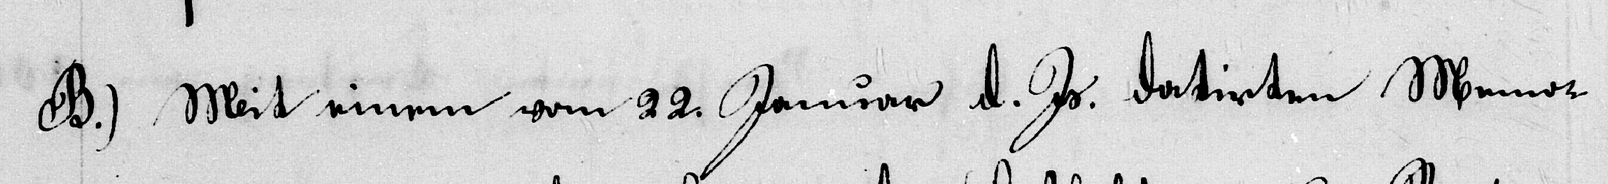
B.) Mit einem vom 22. Januar d. Js. datirten Memo¬
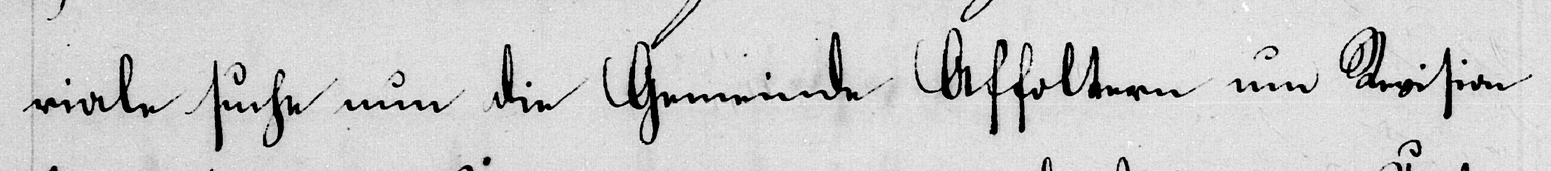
riale suche nun die Gemeinde Affoltern um Revision
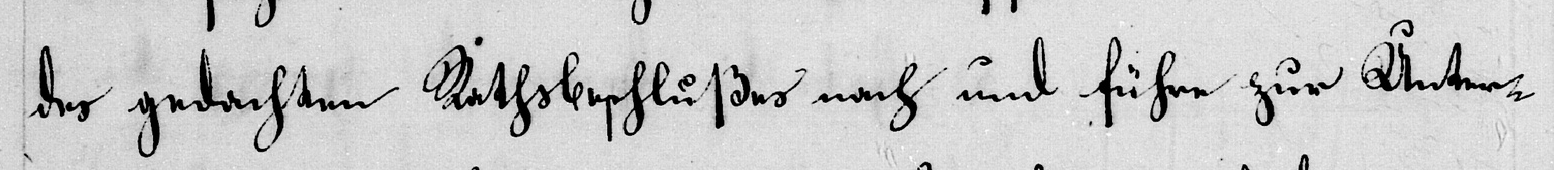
des gedachten Rathsbeschlußes nach und führe zur Unter¬
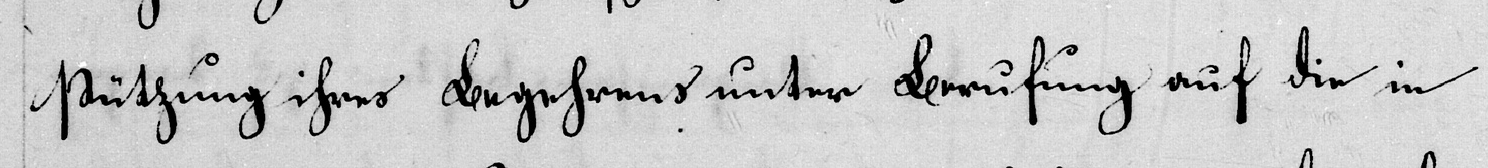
stützung ihres Begehrens unter Berufung auf die in
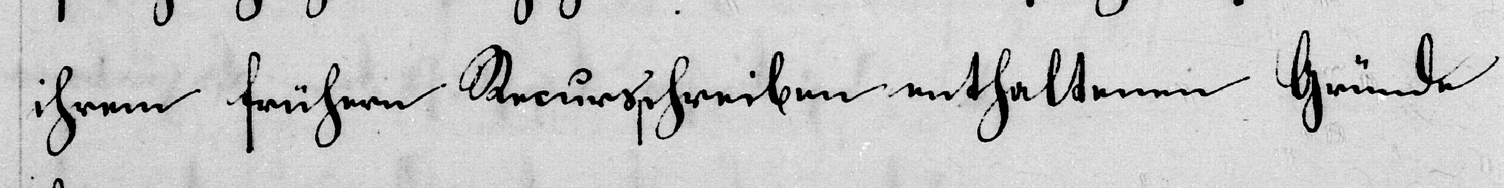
ihrem frühern Recursschreiben enthaltenen Gründe
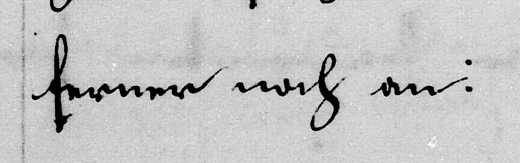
ferner noch an:
